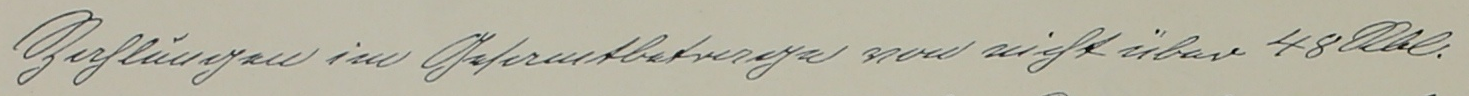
Zahlungen im Gesamtbetrage von nicht über 48 Rbl.
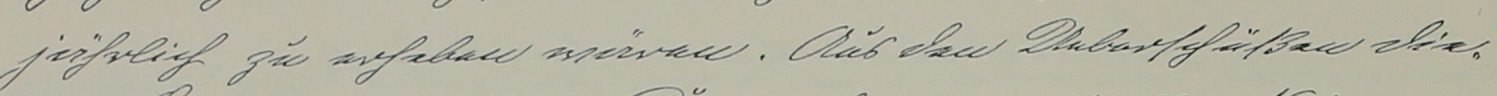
jährlich zu erheben wären. Aus den Ueberschüßen die-
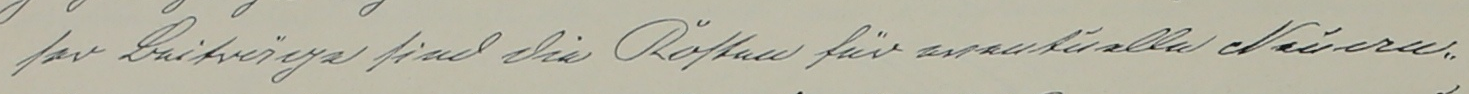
ser Beiträge sind die Kosten für eventuelle Neuan-
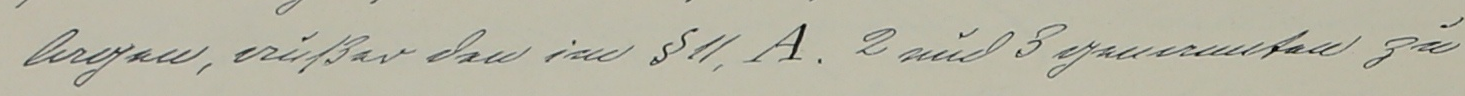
lagen, außer den im § 11, A. 2 und 3 genannten zu
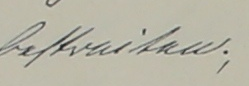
bestreiten;
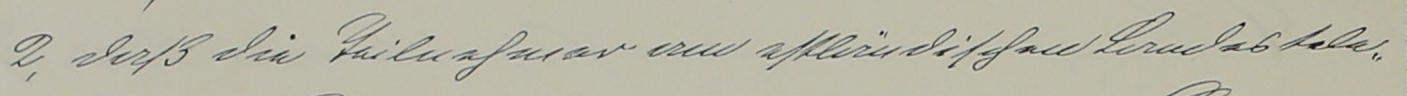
2. daß die Teilnehmer am estländischen Landestele-
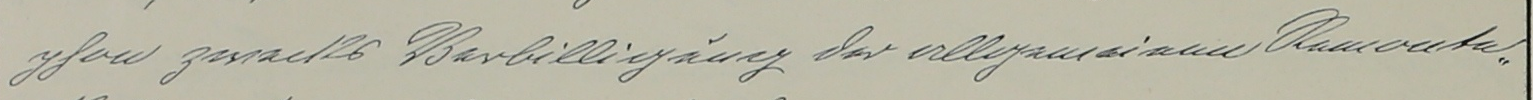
phon zwecks Verbilligung der allgemeinen Remonte-
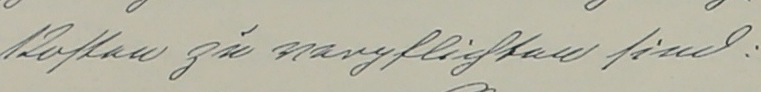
kosten zu verpflichten sind:
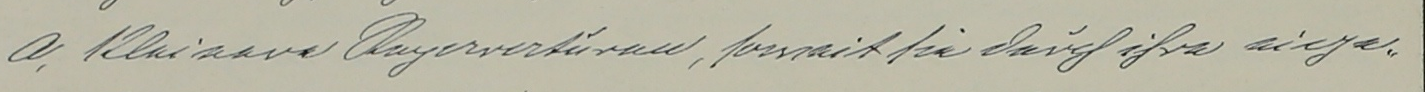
a. kleinere Reparaturen, soweit sie durch ihre eige-
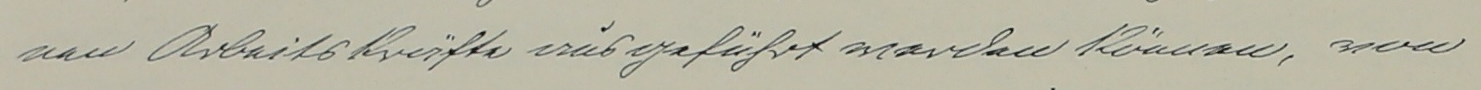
nen Arbeitskräfte ausgeführt werden können, von
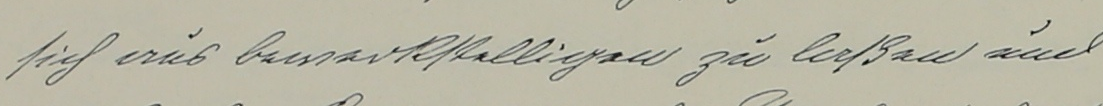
sich aus bewerkstelligen zu laßen und
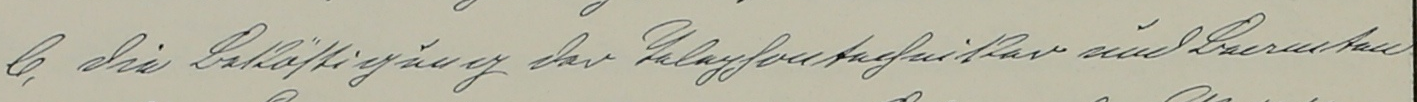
b. die Beköstigung der Telephontechniker und Beamten
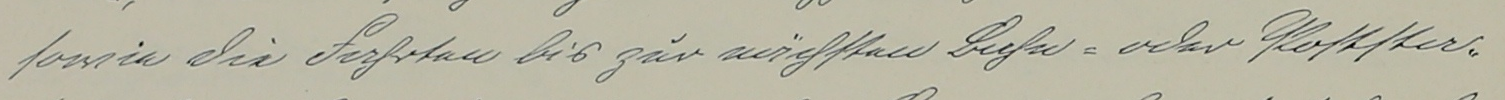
sowie die Fahrten bis zur nächsten Bahn- oder Poststa-
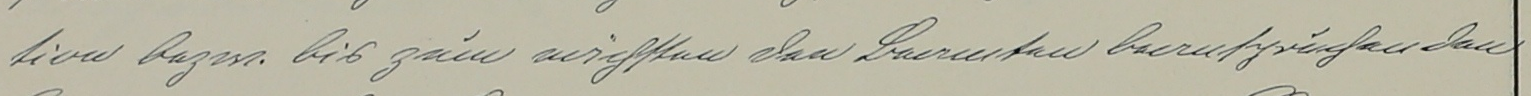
tion bezw. bis zum nächsten den Beamten beanspruchenden
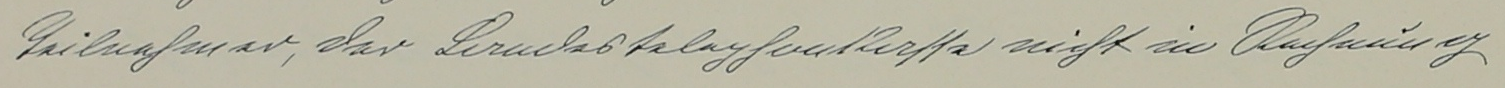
Teilnehmer, der Landestelephonkasse nicht in Rechnung
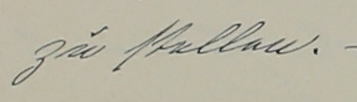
zu stellen.
